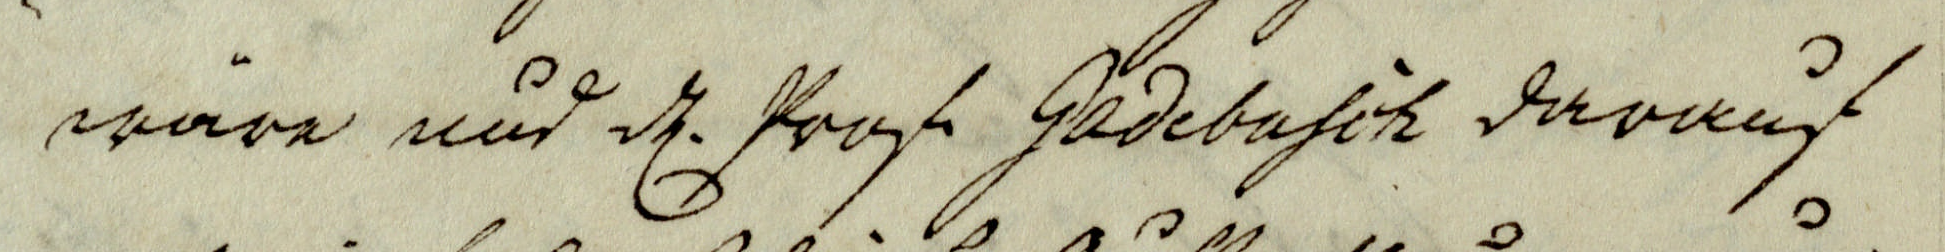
wäre und dh. Prof. Gadebusch darauf
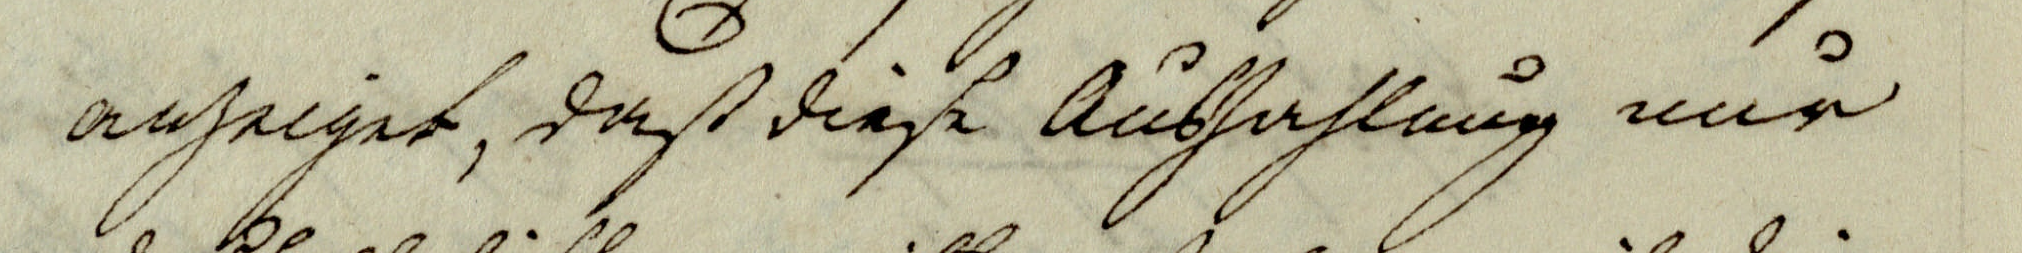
anzeiget, daß diese Auszahlung nur
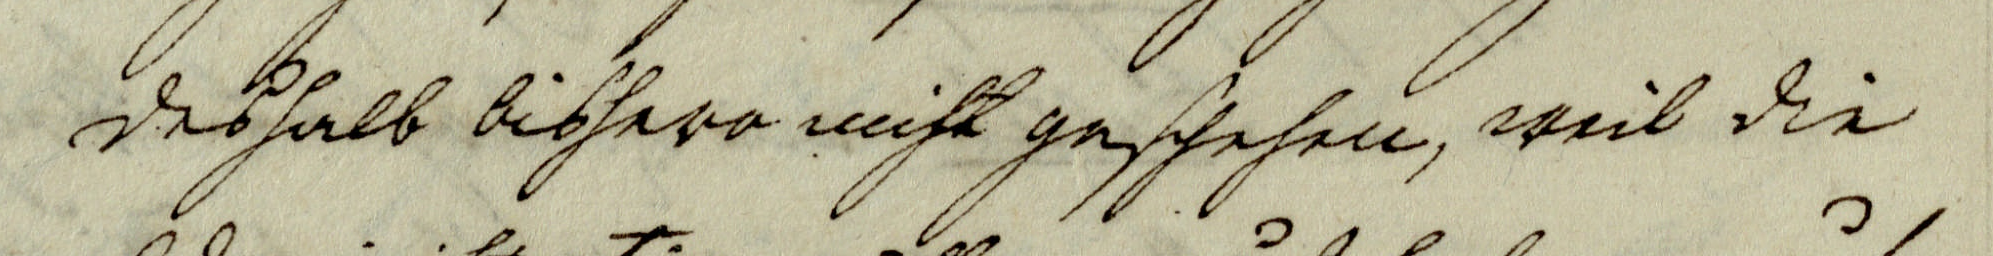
deshalb bishero nicht geschehen, weil die
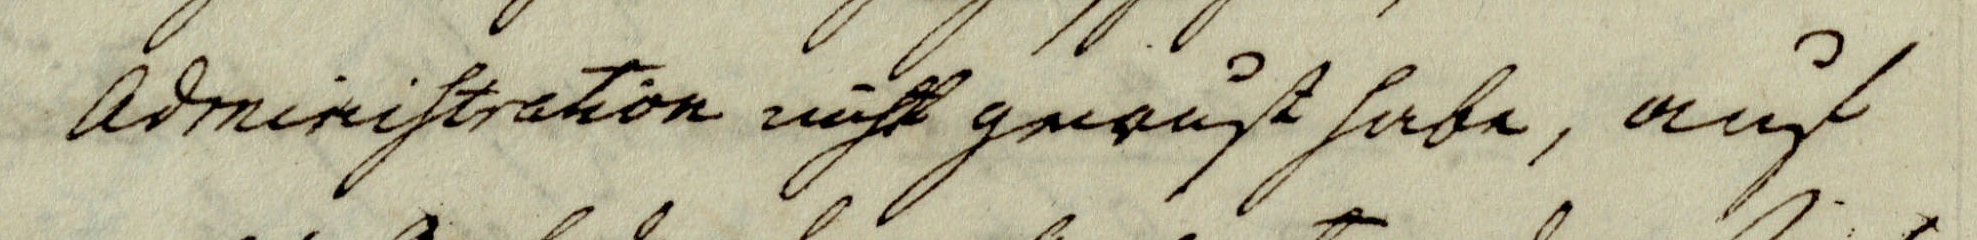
Administration nicht gewußt habe, auf
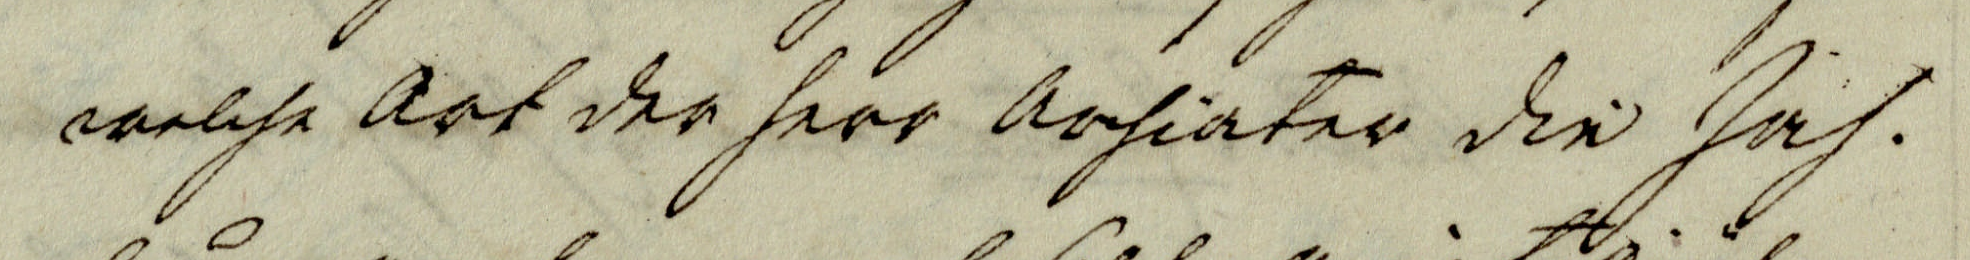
welche Art der Herr Archiater die Zah¬
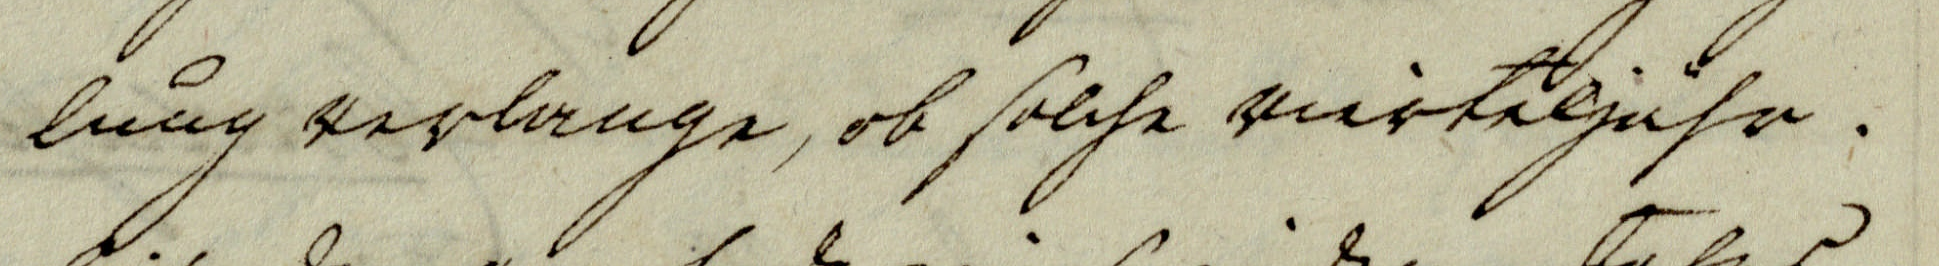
lung verlange, ob solche vierteljähr¬
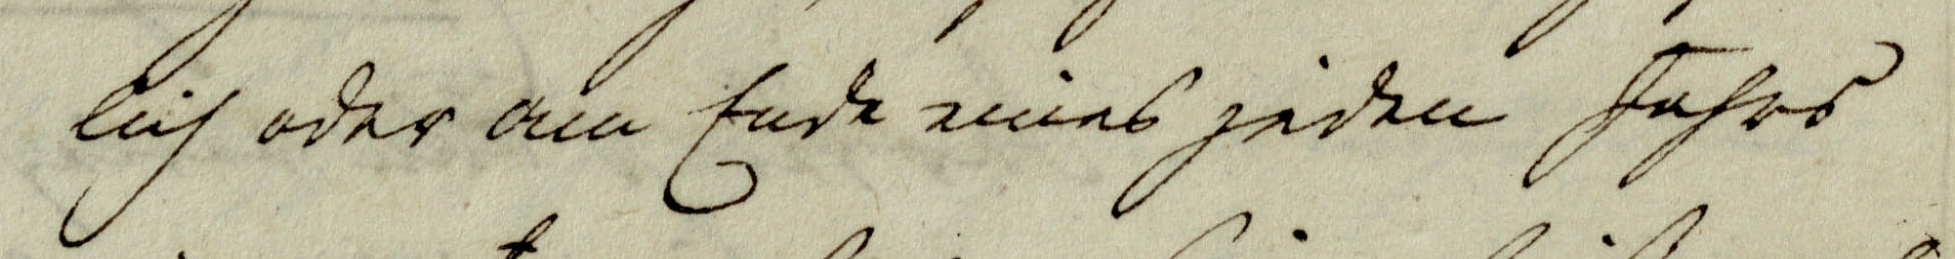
lich oder am Ende eines jeden Jahres
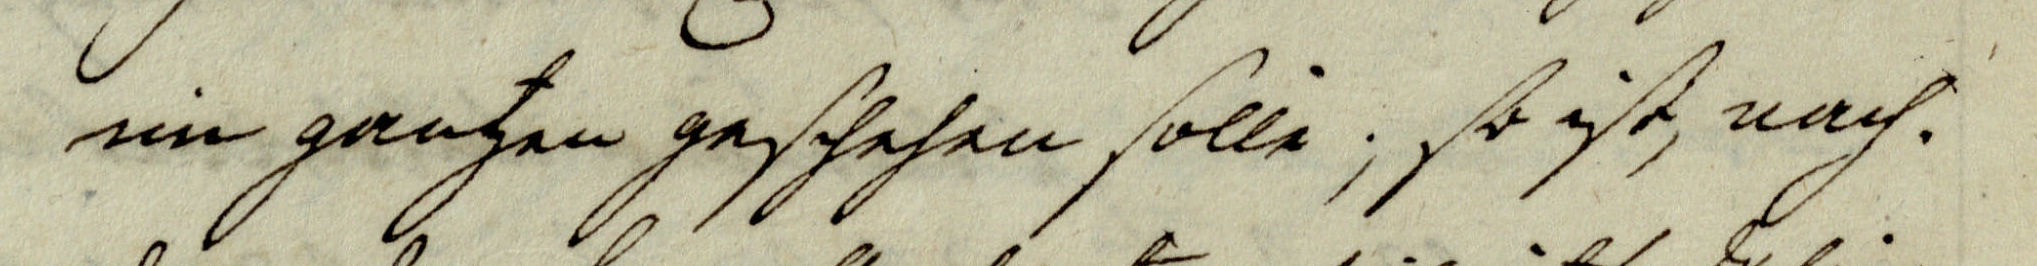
im gantzen geschehen solle, so ist nach¬
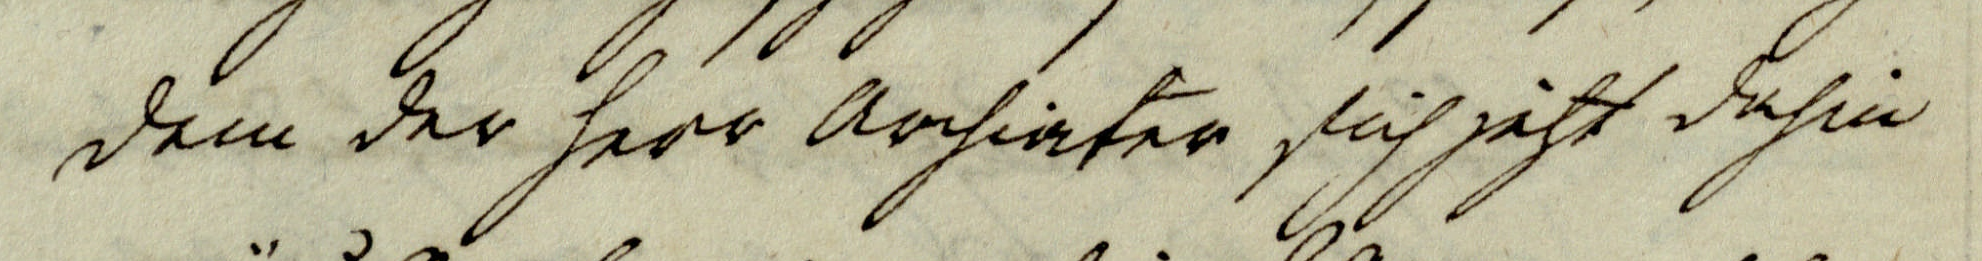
dem der Herr Archiater sich jetzt dahin
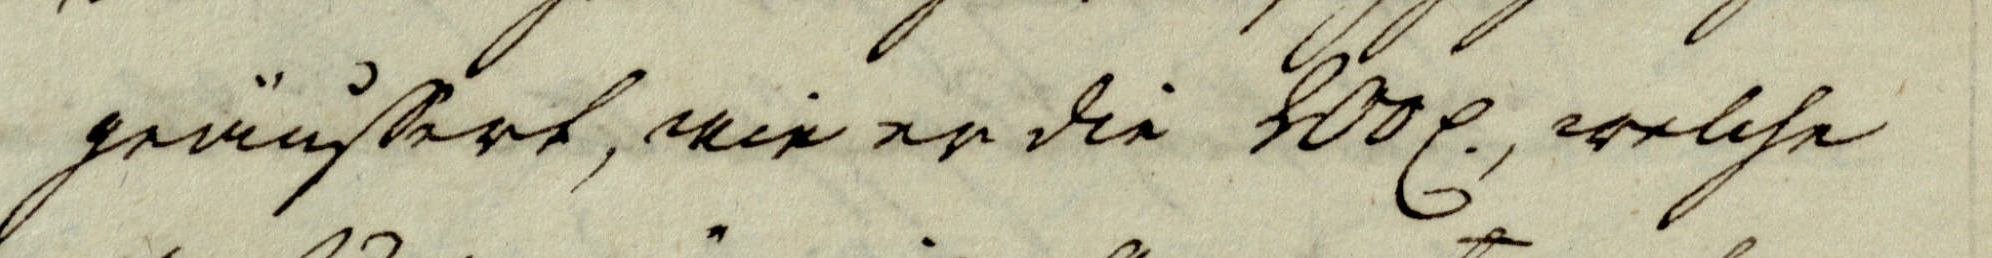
geäussert, wie er die 200 l., welche
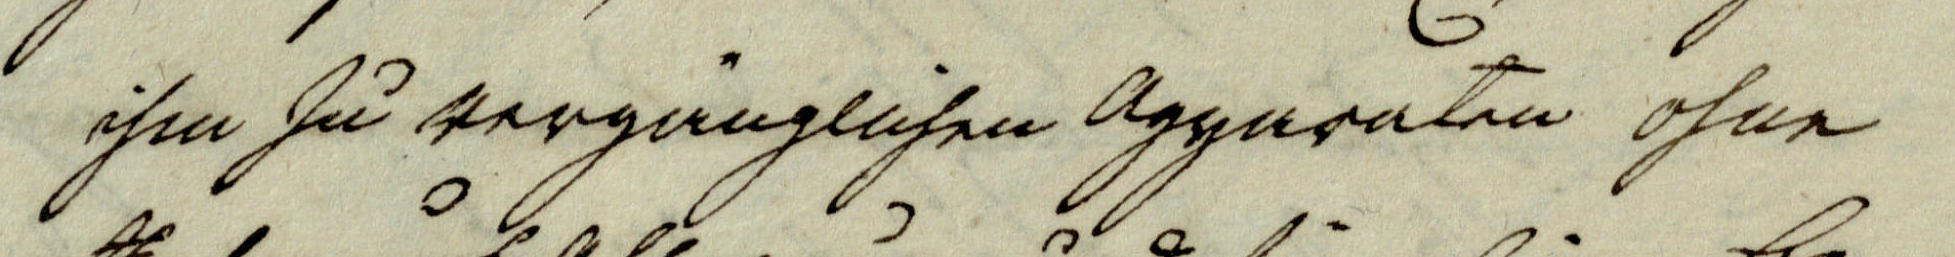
ihm zu vergänglichen Apparaten ohne
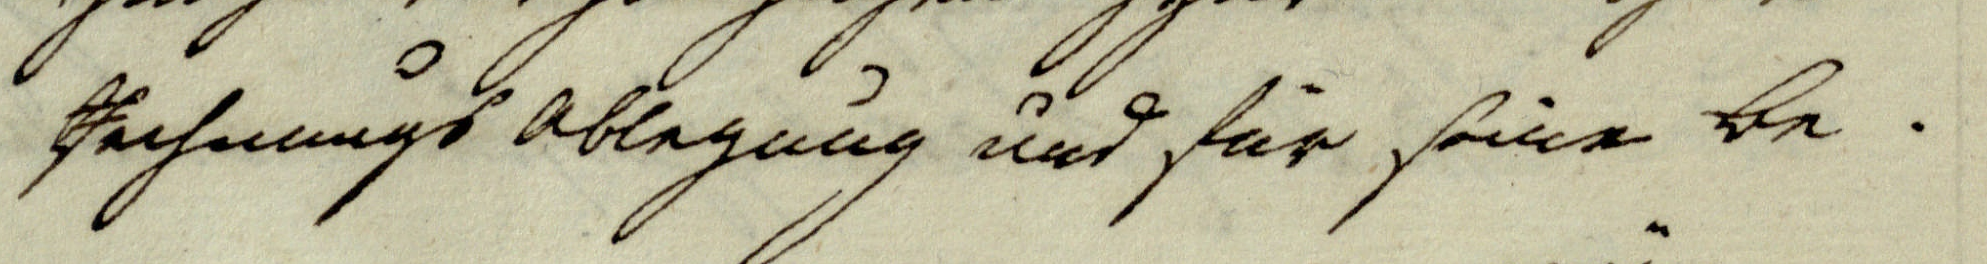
Rechnungs Ablegung und für seine Be¬
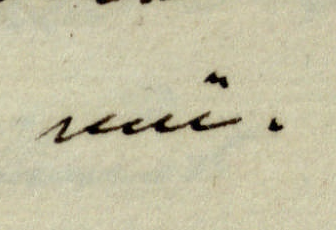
mü¬
